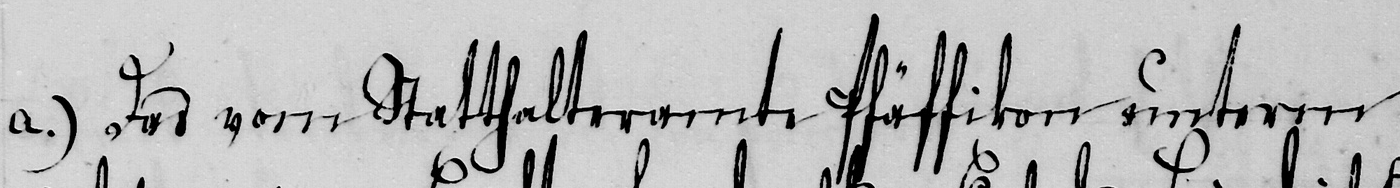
a.) Das vom Statthalteramte Pfäffikon unterm
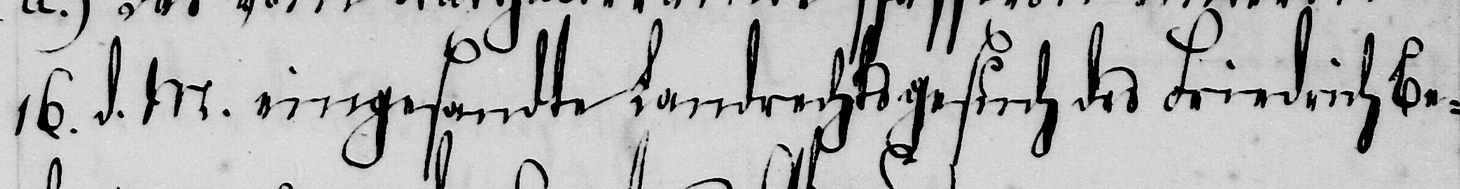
16. d. M. eingesandte Landrechtsgesuch des Friedrich Ne¬
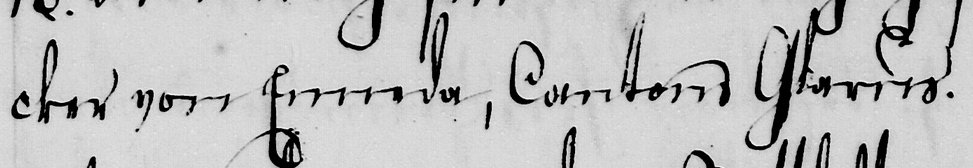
cker von Enneda, Cantons Clarus.
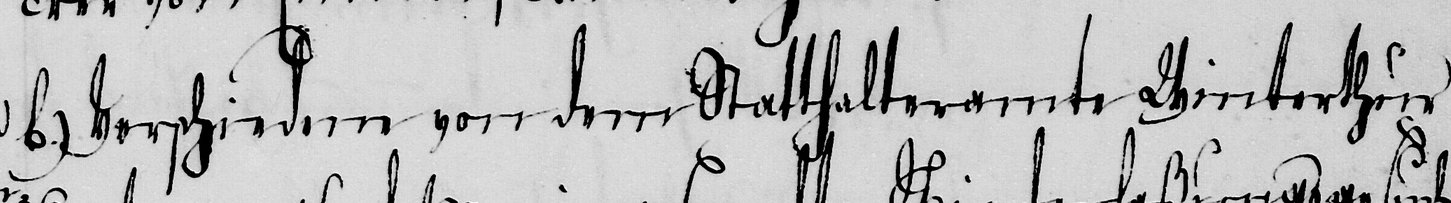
b.) Verschiedene von dem Statthalteramte Winterthur
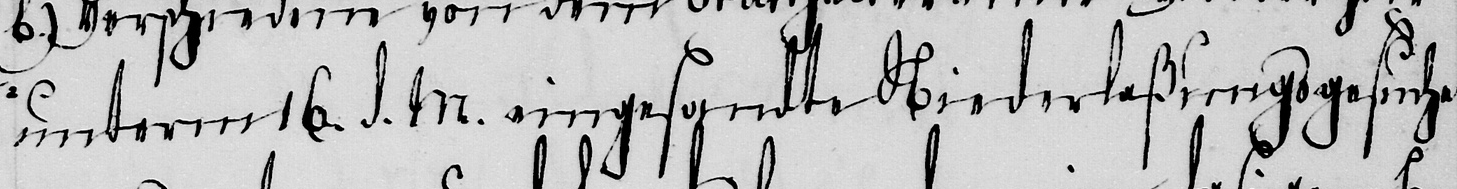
unterm 16. d. M. eingesandte Niederlaßungsgesuche
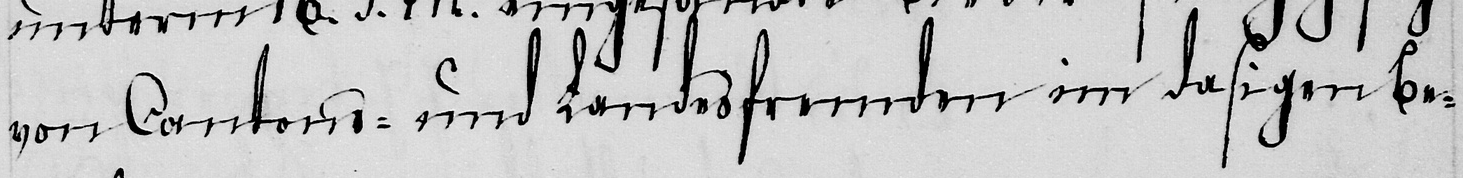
von Cantons- und Landesfremden im dasigen Be¬
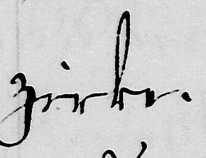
zirke.
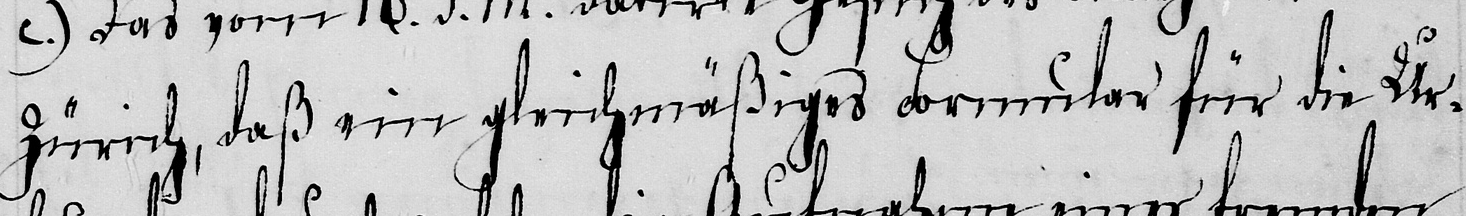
Zürich, daß ein gleichmäßiges Formular für die Ur¬
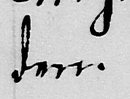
den
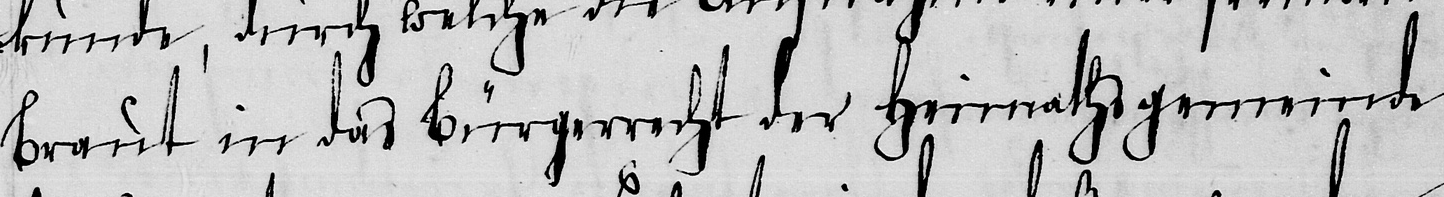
Braut in das Bürgerrecht der Heimathsgemeinde
